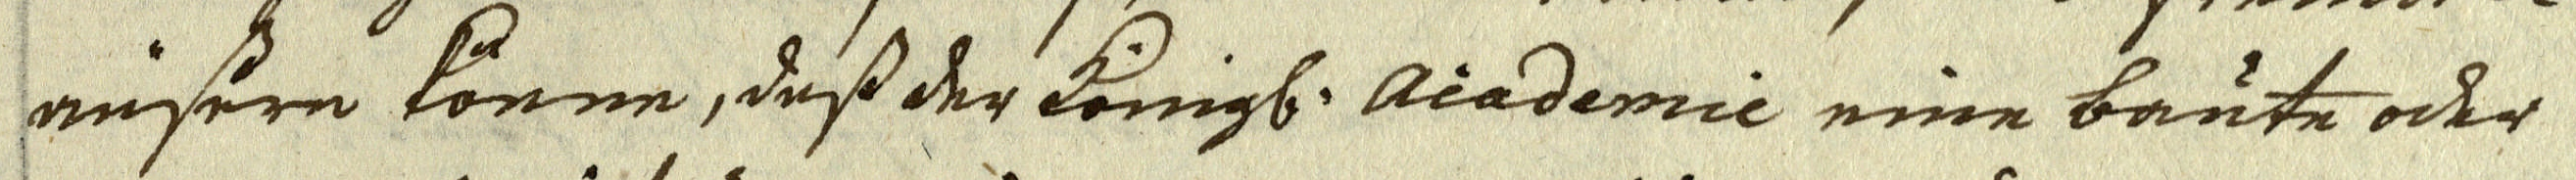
äußern könne, daß der Königl. Academie eine Baute oder
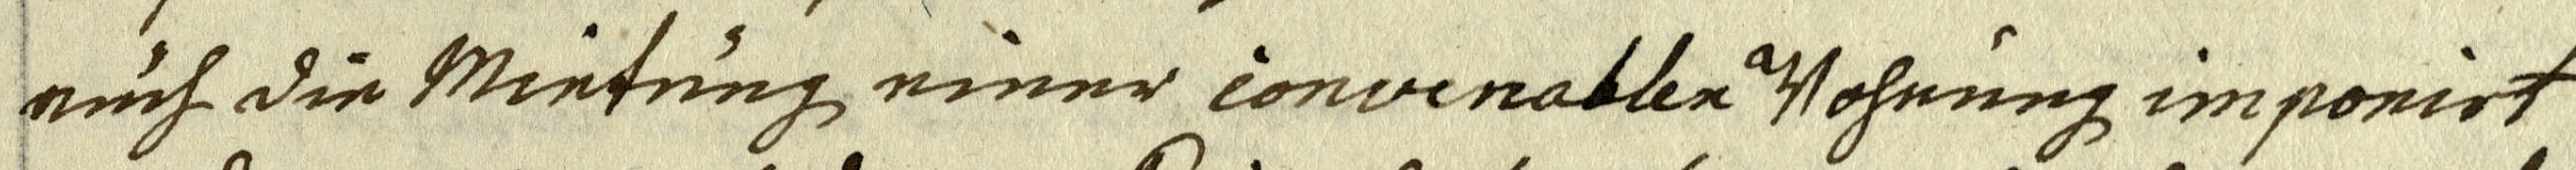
auch die Mietung einer convenablen Wohnung imponirt
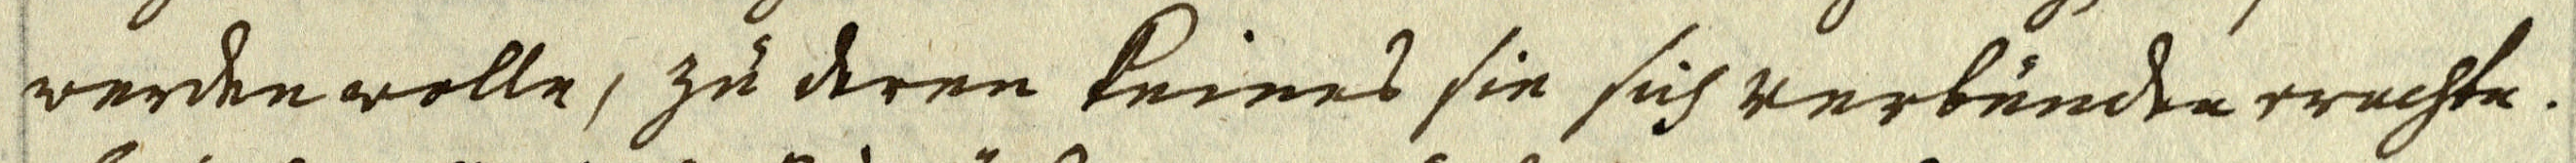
werden wolle, zu deren keines die sich verbunden erachte,
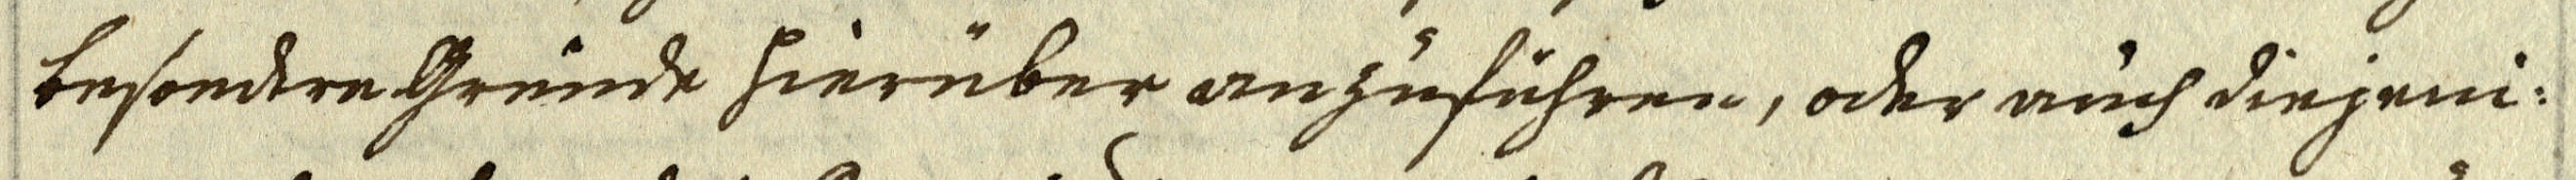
besondere Gründe hierüber anzuführen, oder auch diejeni¬
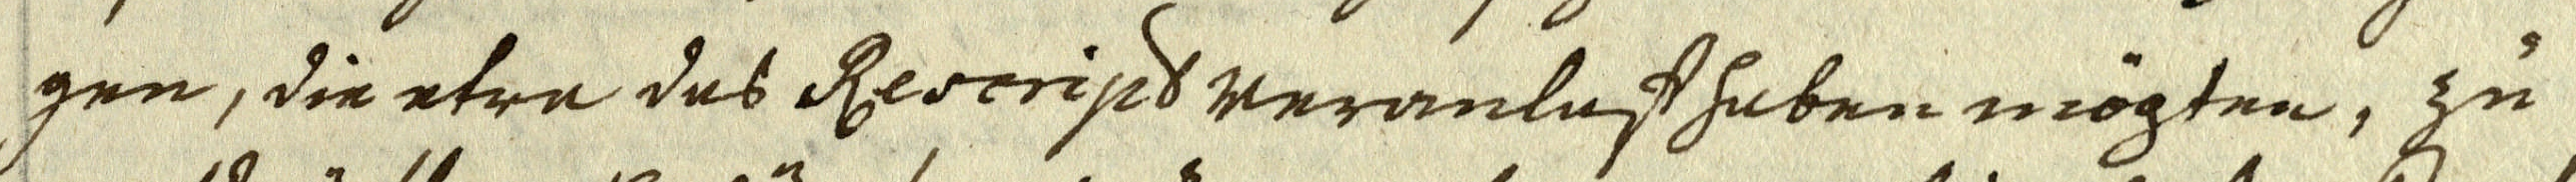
gen, die etwa das Rescript veranlast haben mögten, zu
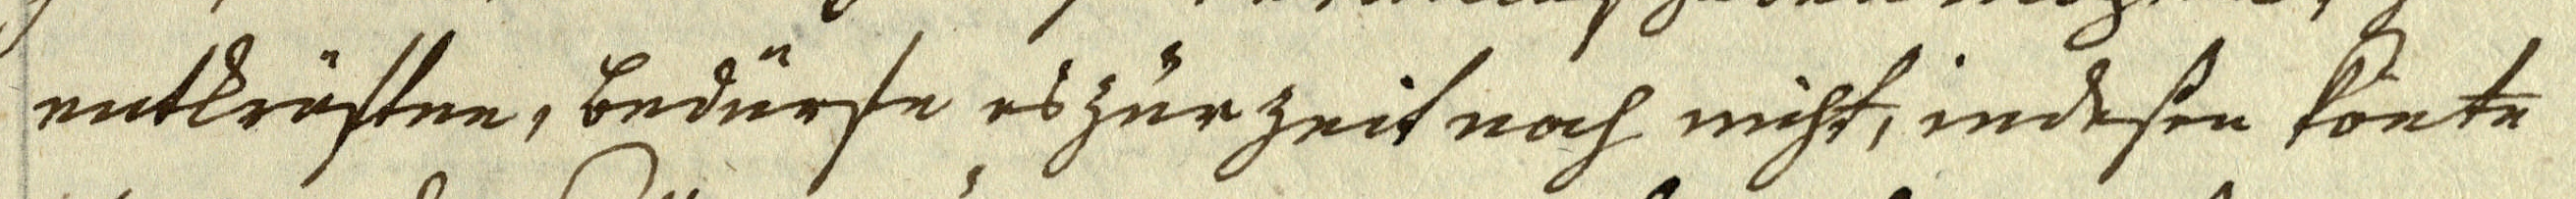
entkräften, bedürfe es zur Zeit noch nicht, indeßen könte
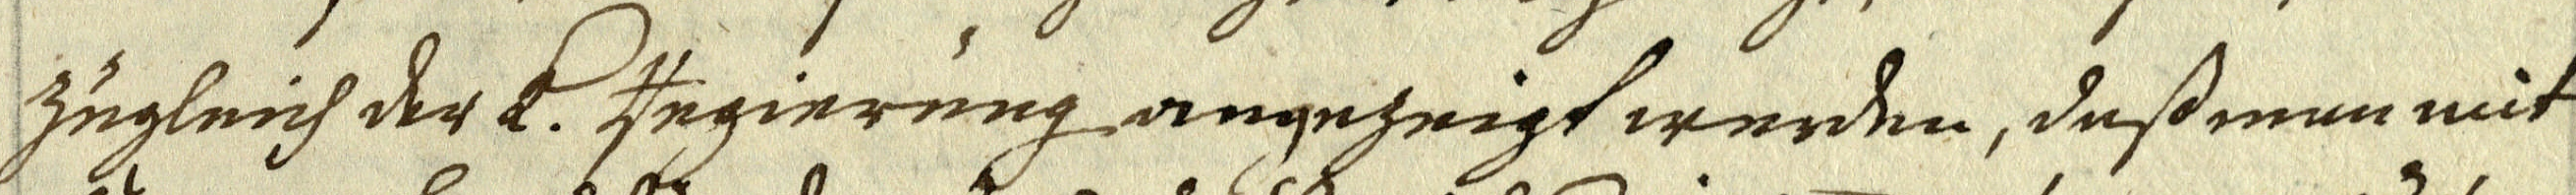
zugleich der K. Regierung angezeigt werden, daß wenn mit
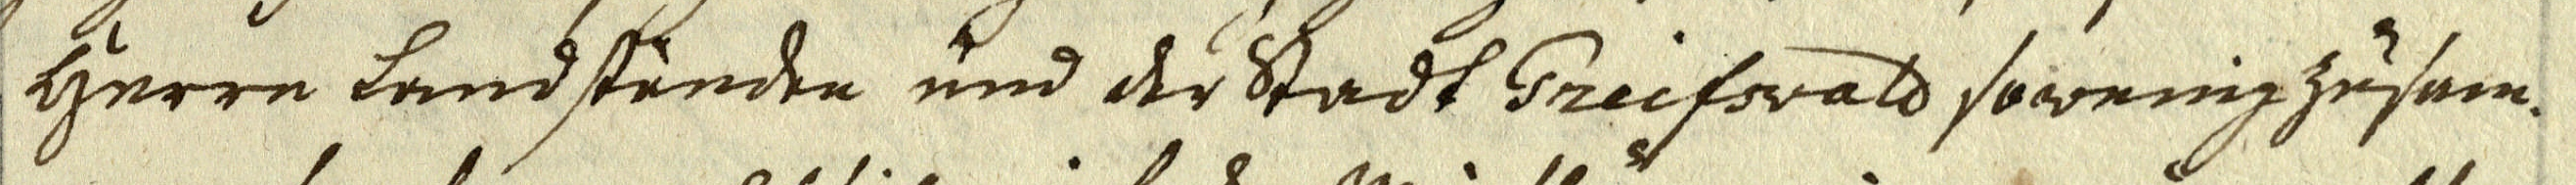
Herrn Landständen und der Stadt Greifswald sowenig zusam¬
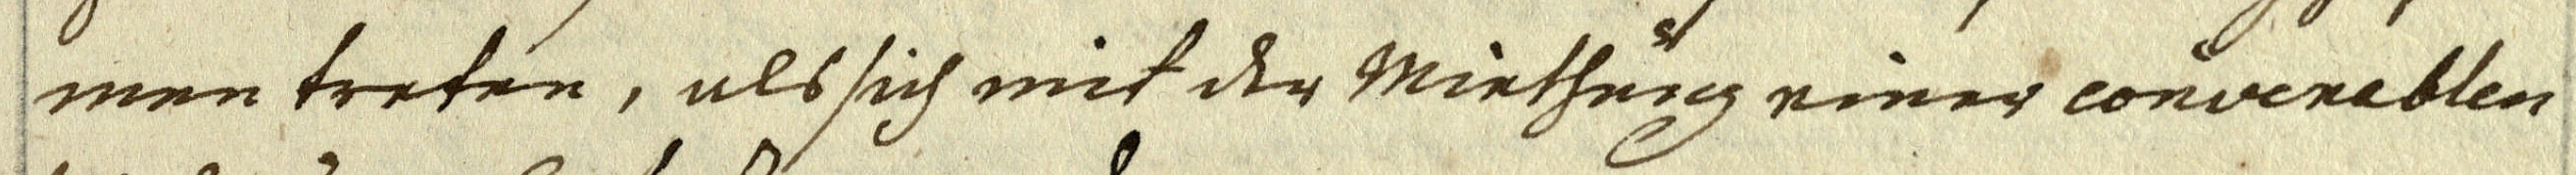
men treten, als sich mit der Miethung einer convenablen
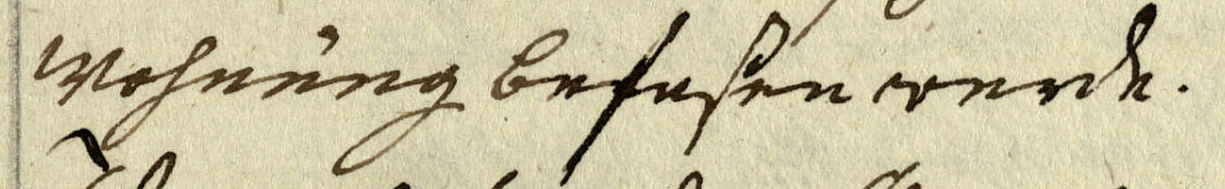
Wohnung befaßen werde.
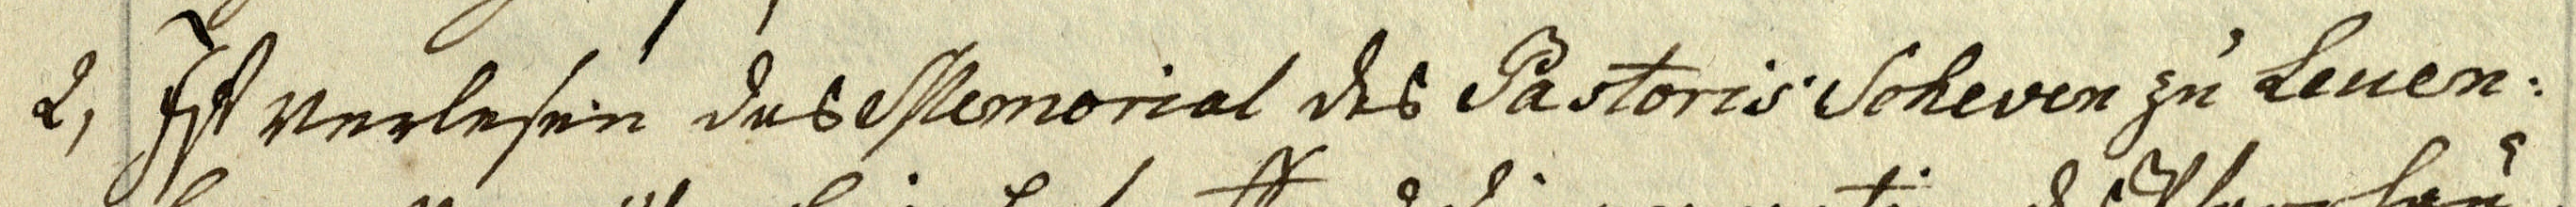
2, Ist verlesen das Memorial des Pastoris Scheven zu Leven¬
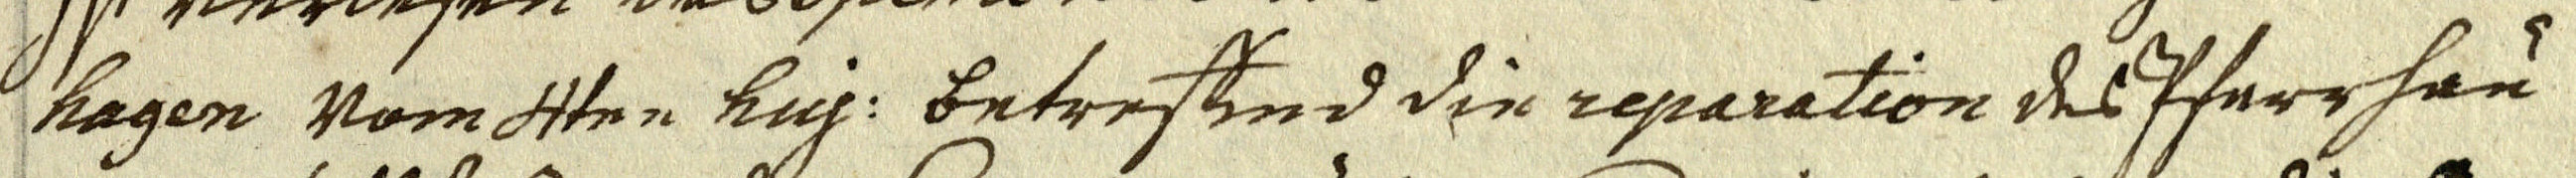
hagen vom 4 ten huj. betreffend die reparation des Pfarrhau¬
